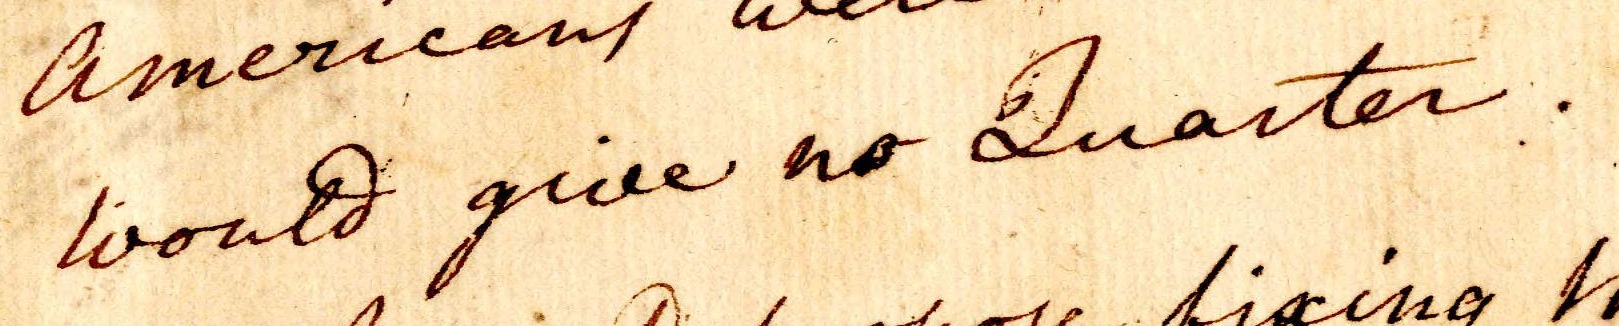would give no Quarter.
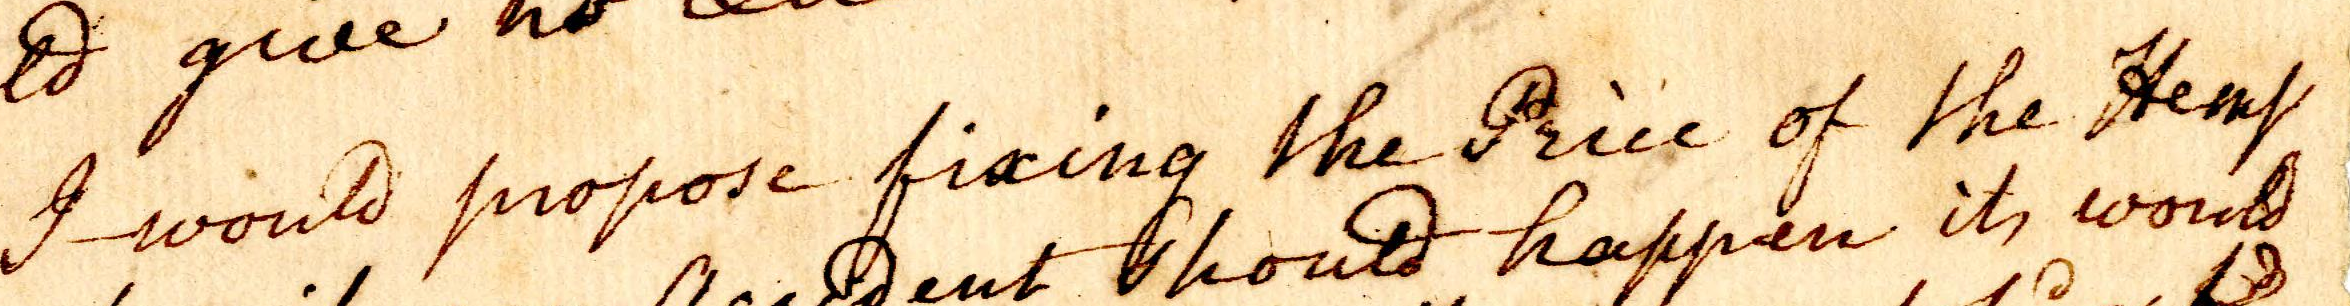I would propose fixing the Price of the Hemp
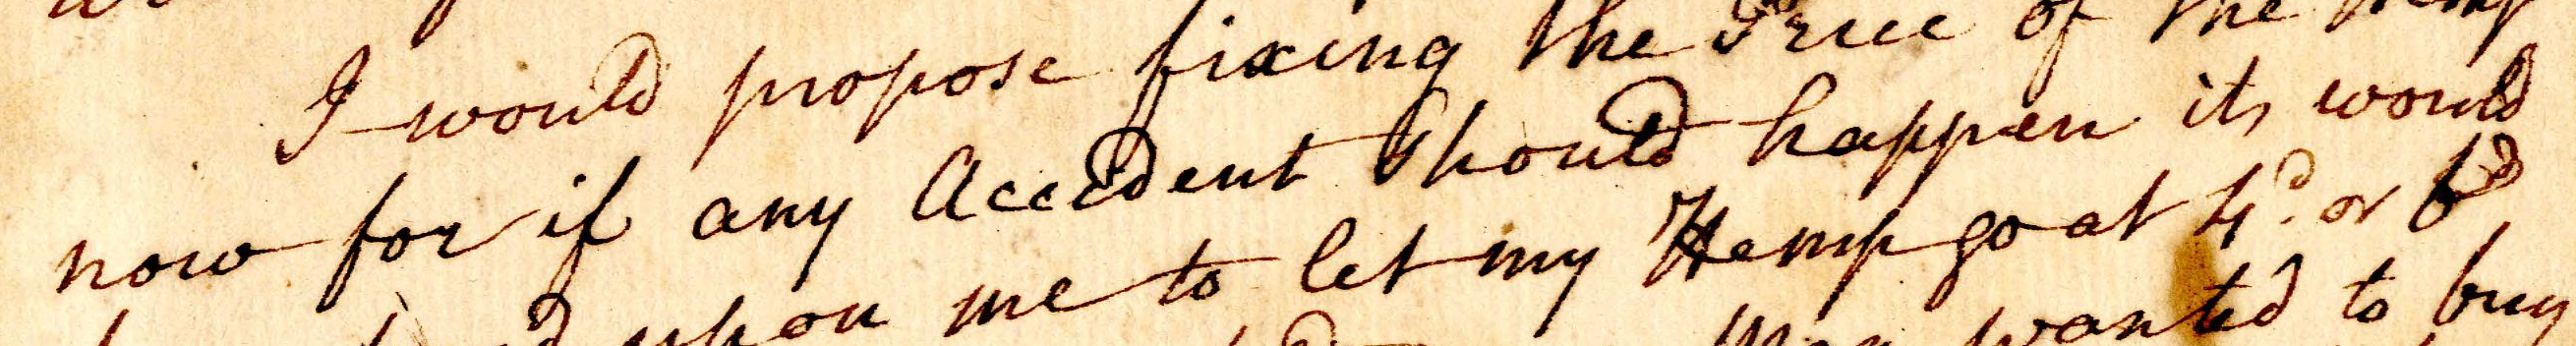now for if any Accident should happen its would
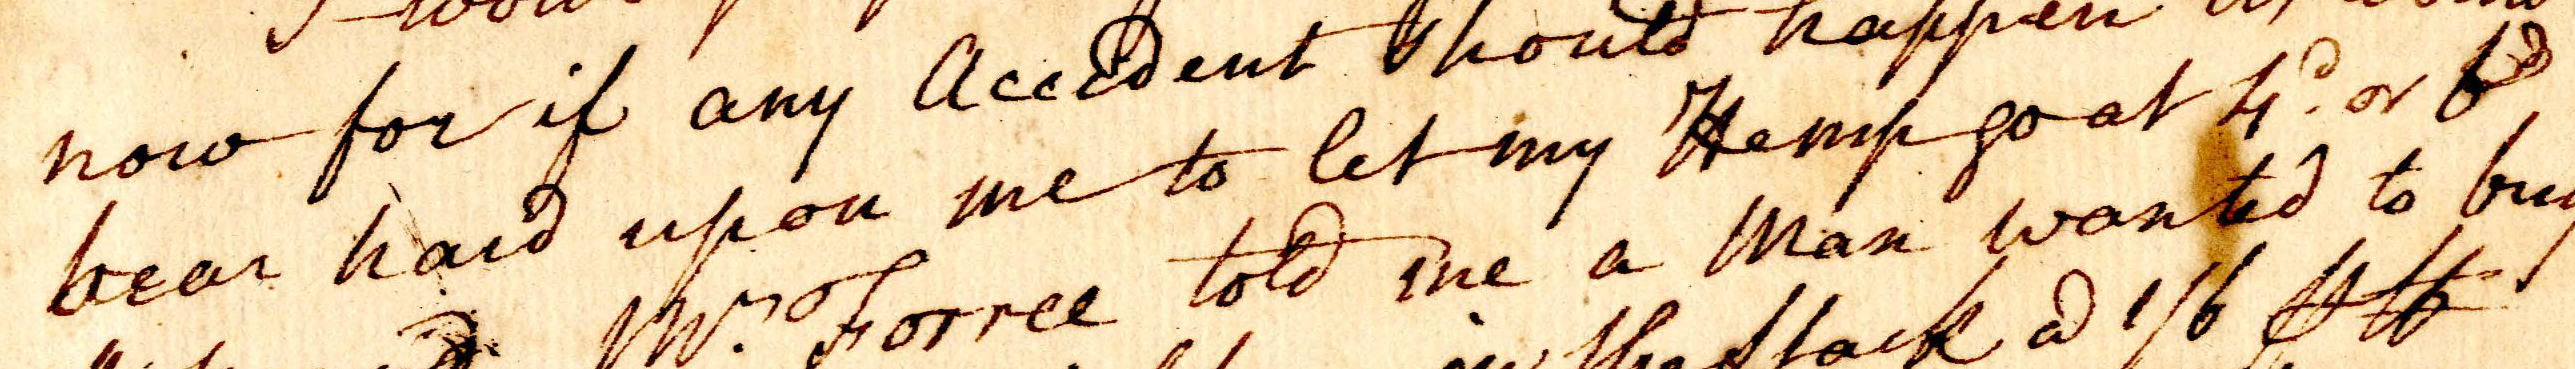bear hard upon me to let my Hemp go at 4^d. or 6^d
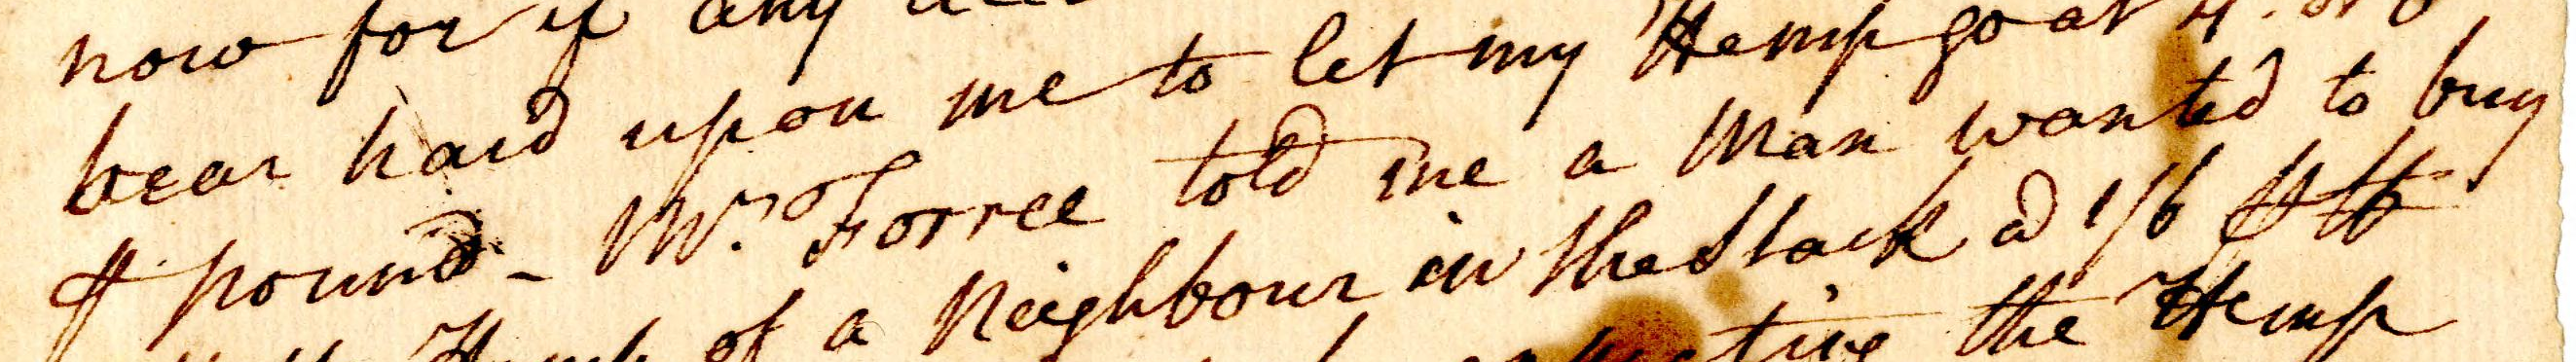per pound- M^rs. Forree told me a Man wanted to buy
